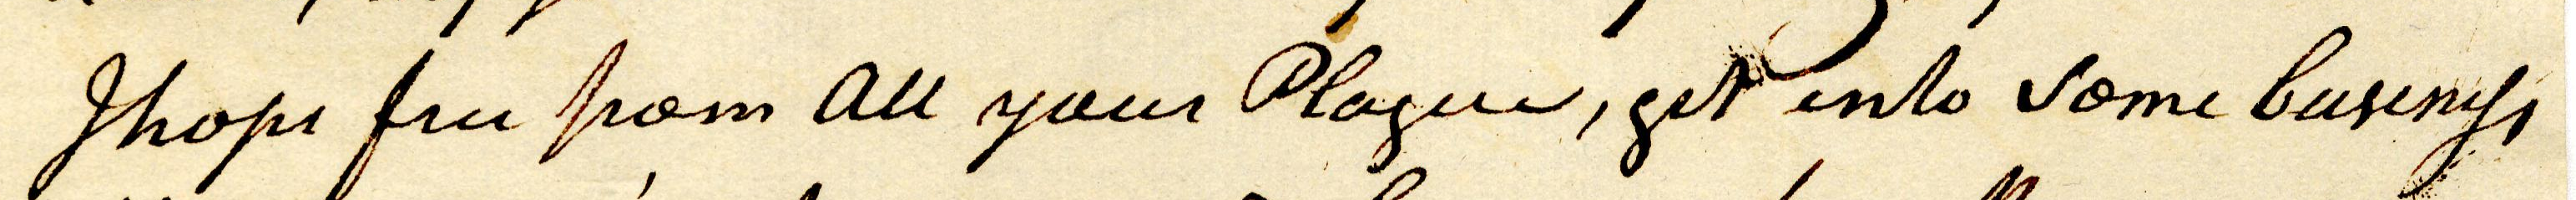I hope free from All your Plague, get unto some business
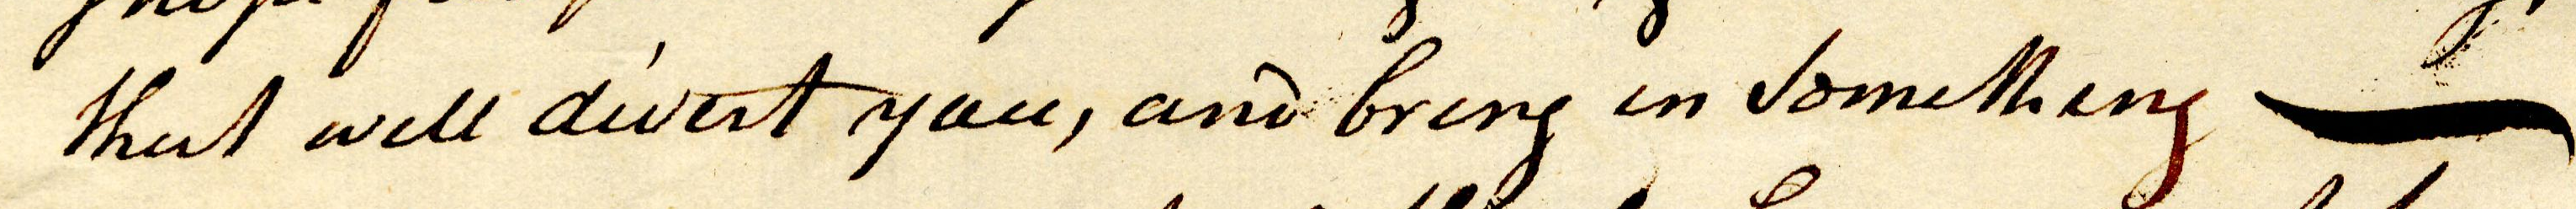that will divert you, and bring in something-
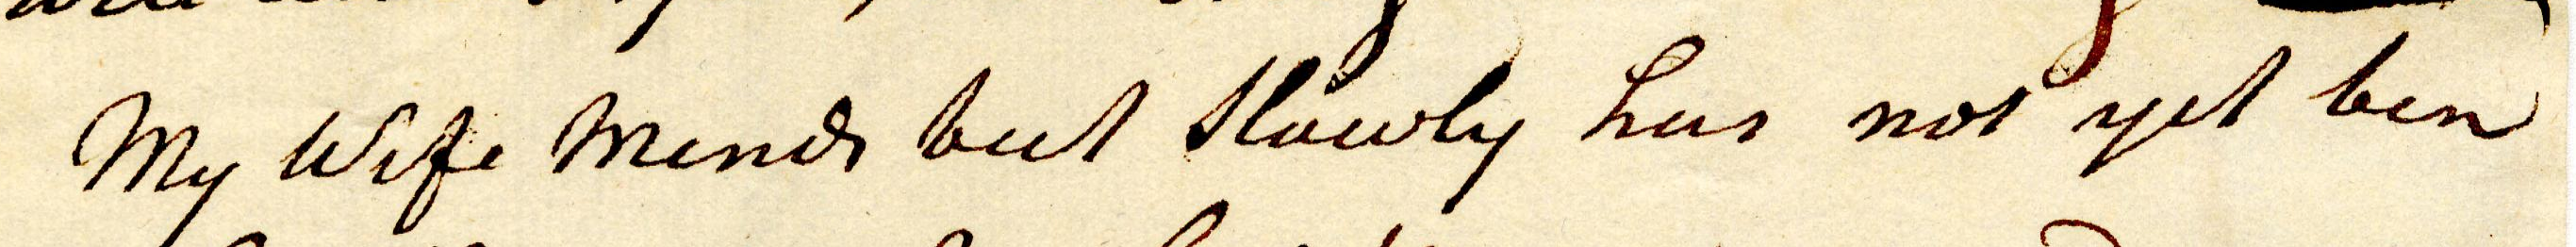My Wife mends but slowly has not yet been
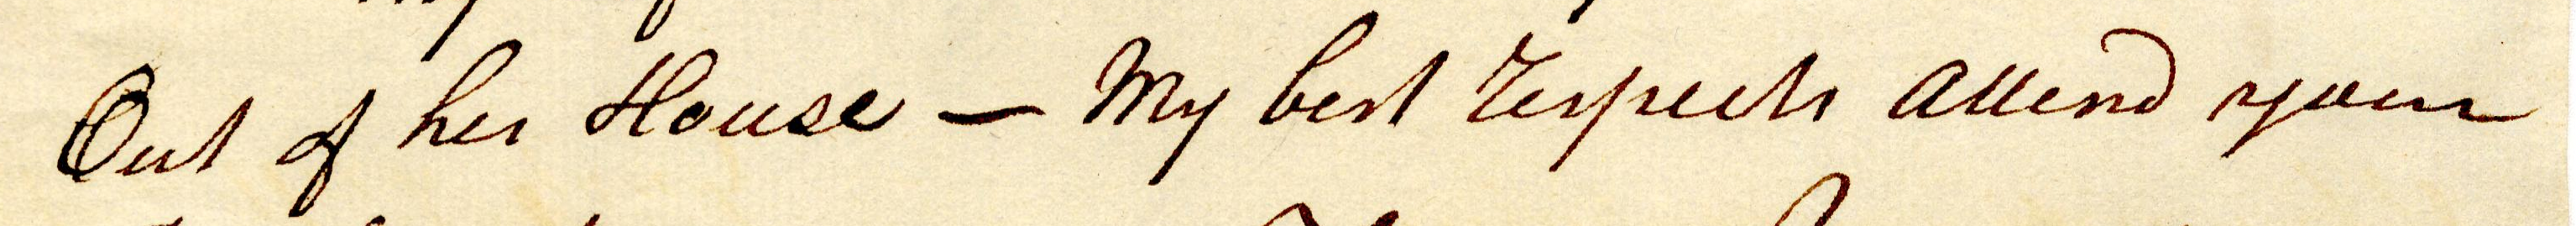Out of her House- my best respects attend your
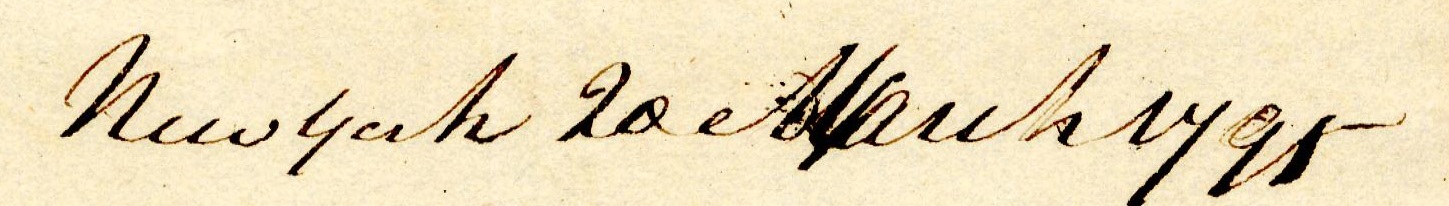New York 20 March 1795
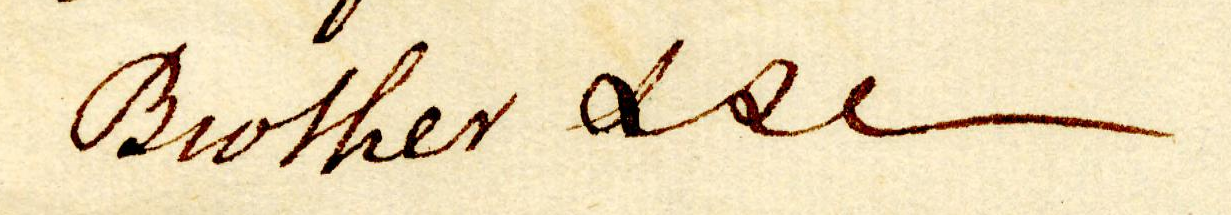Brother &ce
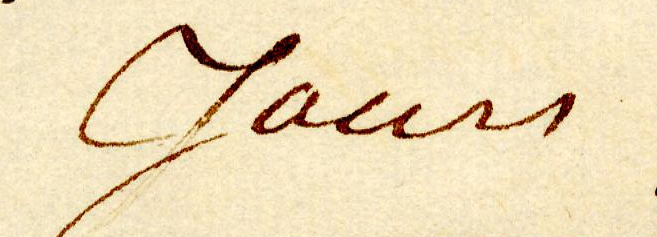Yours
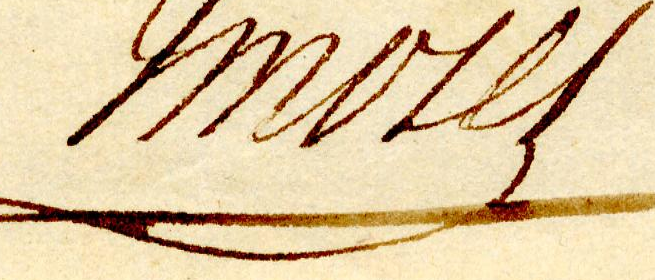I Moses
